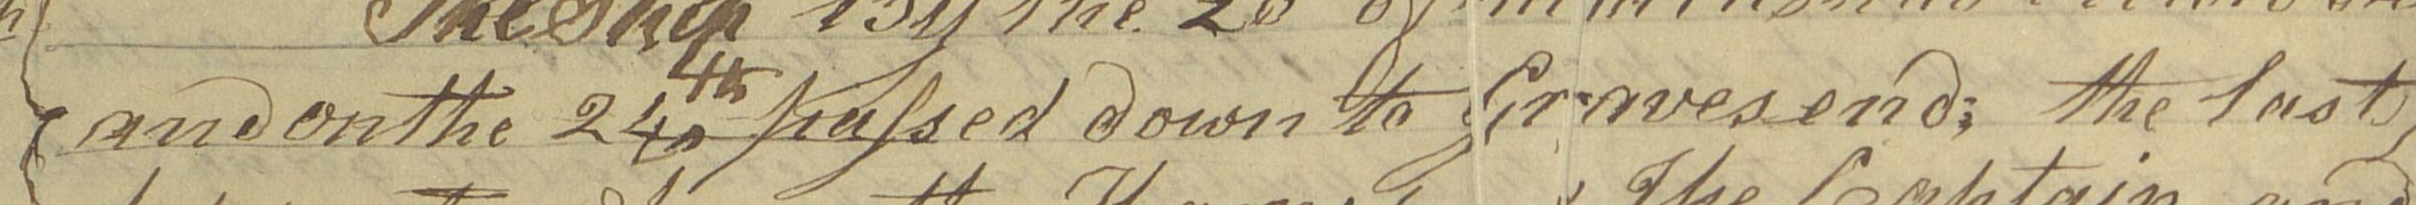and on the 24^th pulsed down to Gravesend; the last pl-
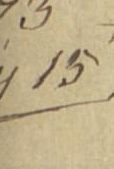7 15^th
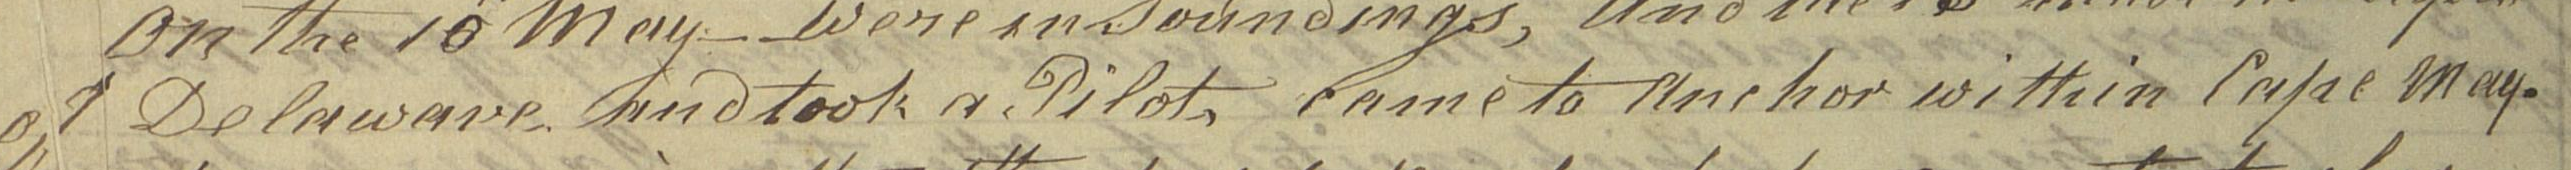of Delaware and took a Pilot, came to Anchor within Cape May.
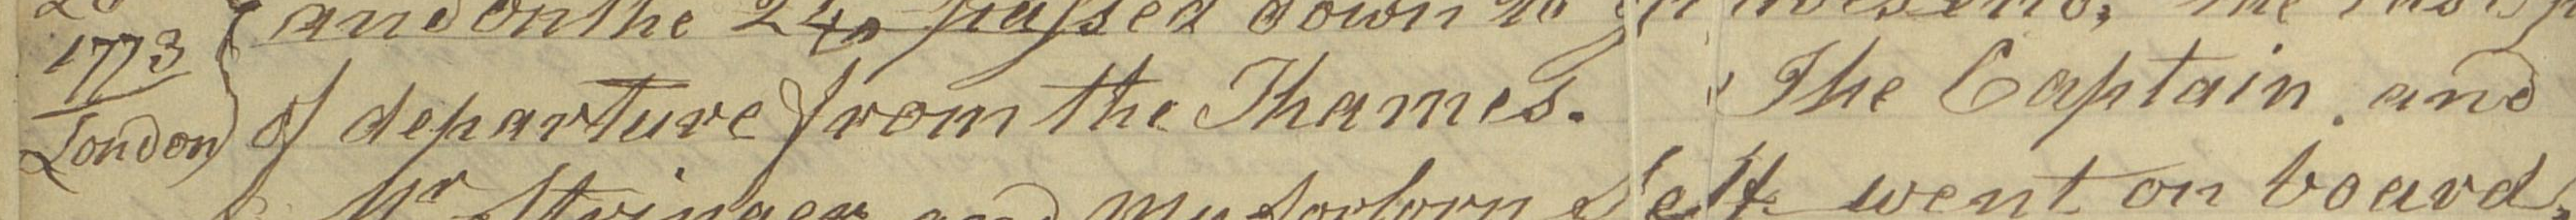London of departure from the Thames. The Captain. and
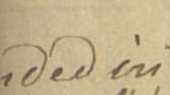-ded in
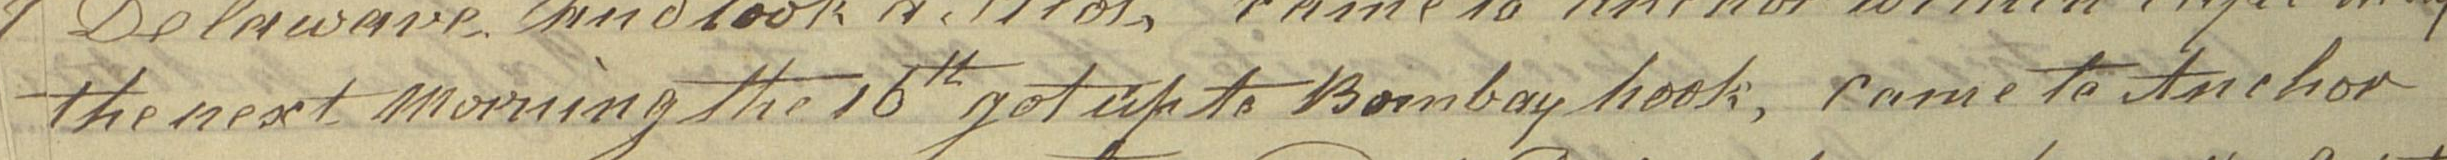the next Morning the 16^th got up to Bombay hook, came to Anchor
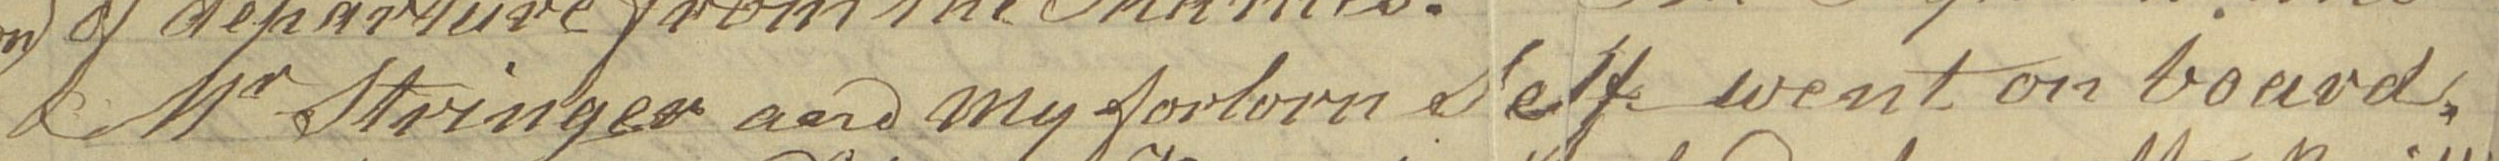M^r. Stringer and my forlorn Self went on board.
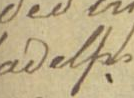-adolph
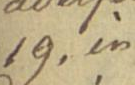19 in
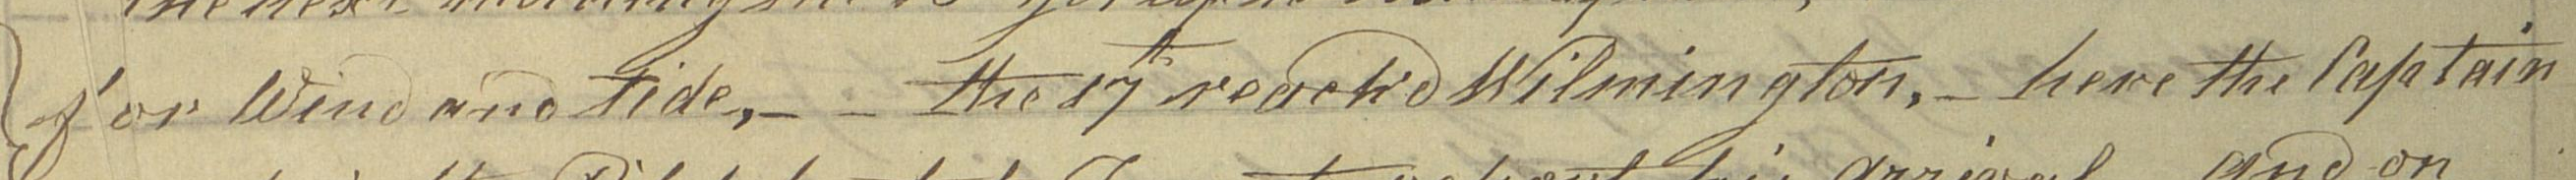for Wind and tide, The 17^th reach'd Wilmington, here the Captain
